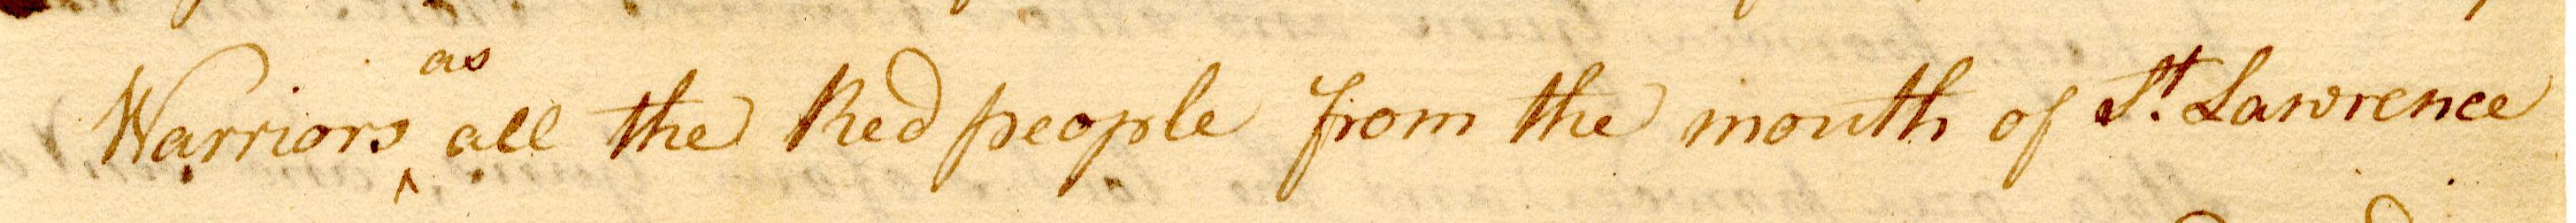Warriors ^ all the Red people from the mouth of S^t. Lawrence
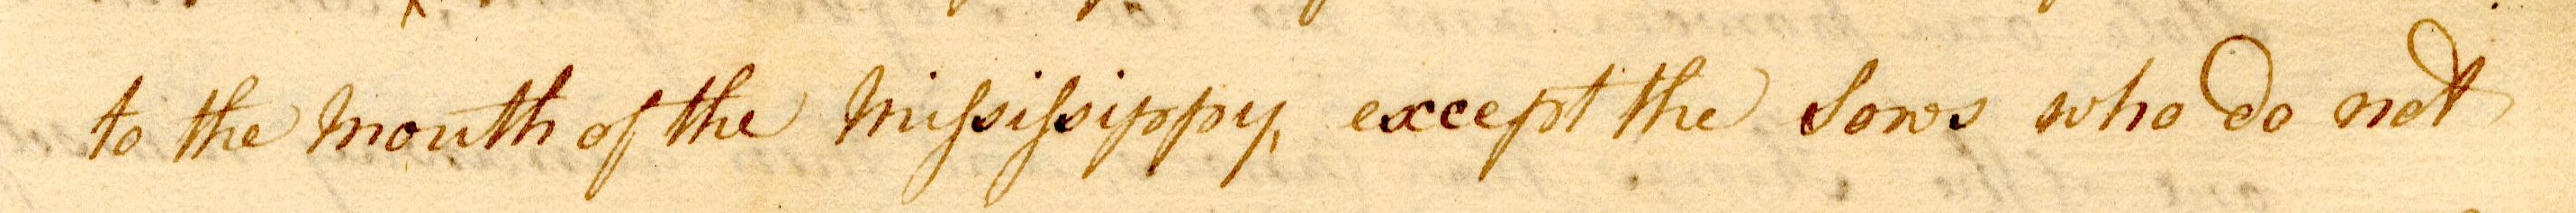to the mouth of the Mississippy except the Sons who do not
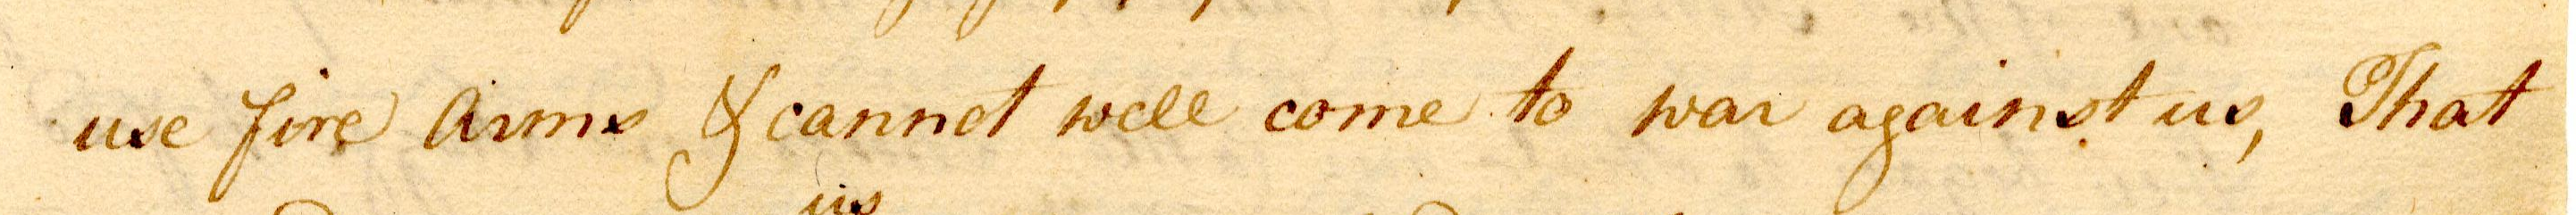use fire Arms & cannot well come to war against us, That
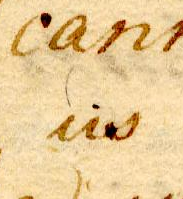us
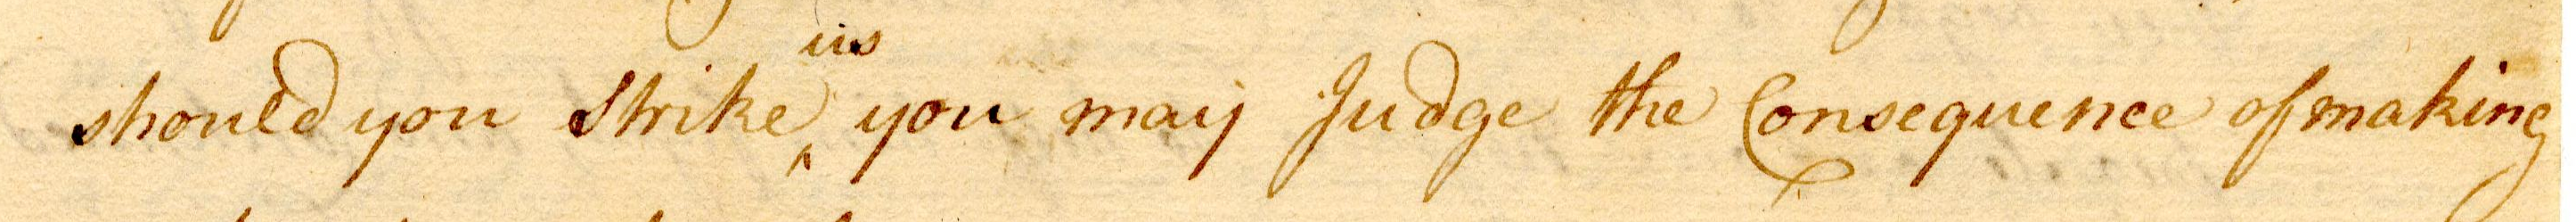should you Strike ^ you may Judge the Consequence of making
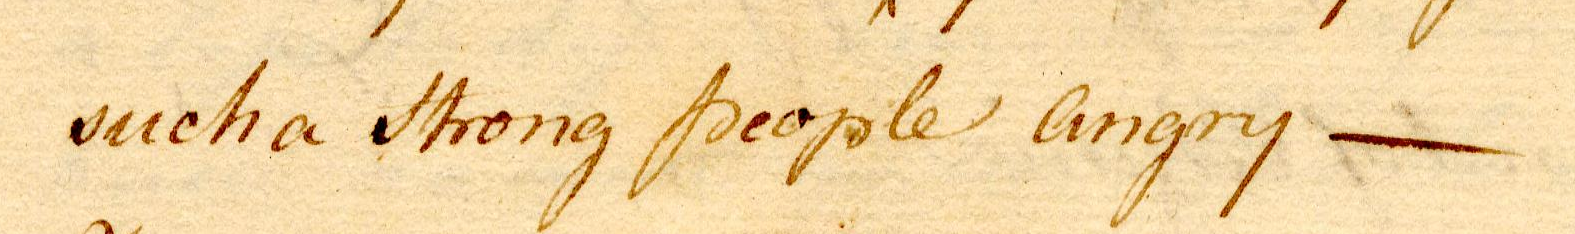such a Strong people angry-
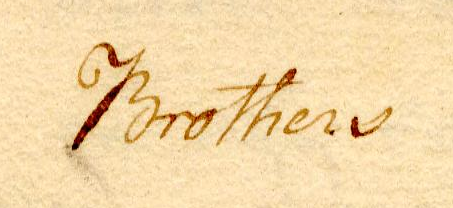Brothers
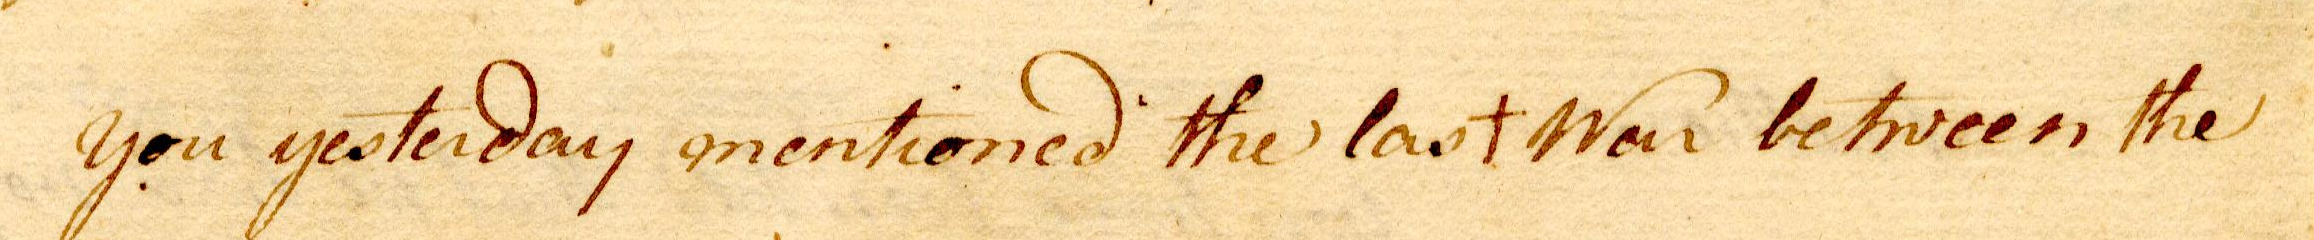You yesterday mentioned the last War between the
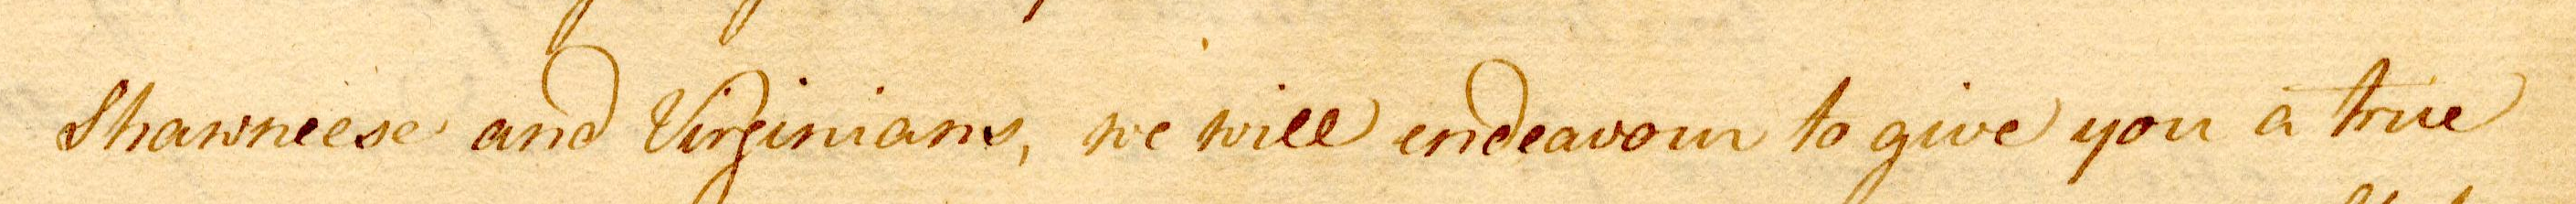Shawneese and Virginians, we will endeavour to give you a true
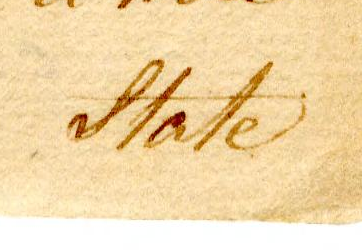State
